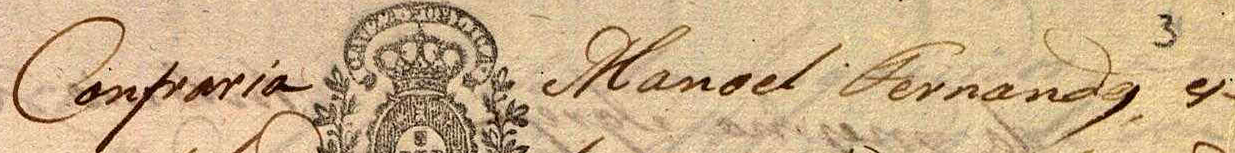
Confraria Manoel Fernandes es
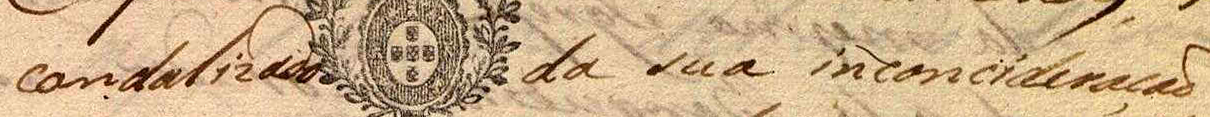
candalizado da sua inconcideraçaõ
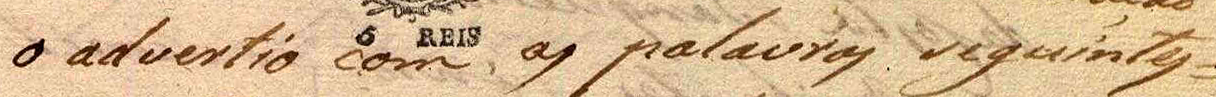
o advertio com as palavras seguintes
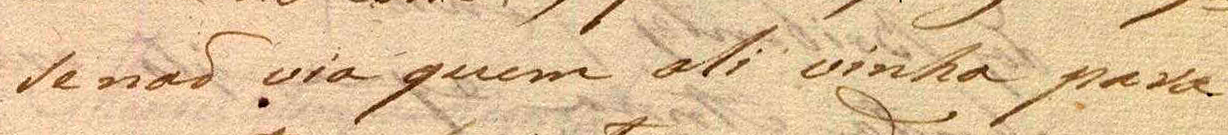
se naõ via quem ali vinha para
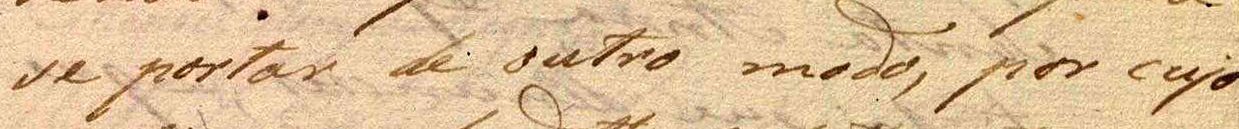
se portar de outro modo, por cujo
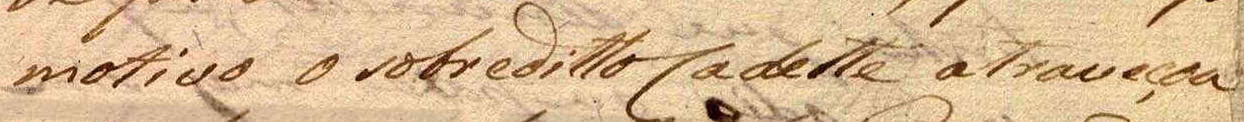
motivo o sobreditto Cadette atraveçou
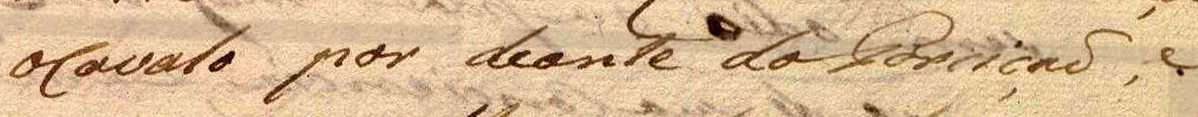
a Cavalo por deante da Porciçaõ, e
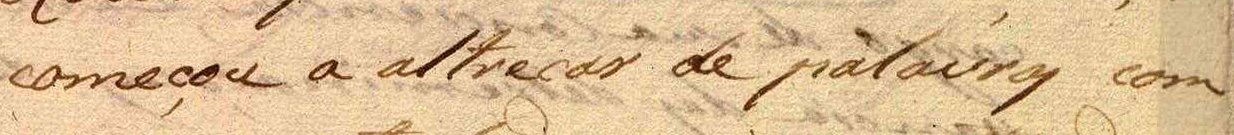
começou a altrecar de palavras com
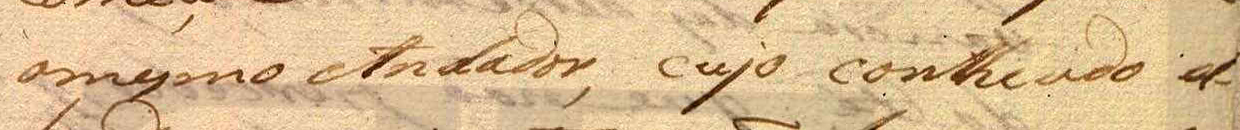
o mesmo Andador, cujo contheudo el
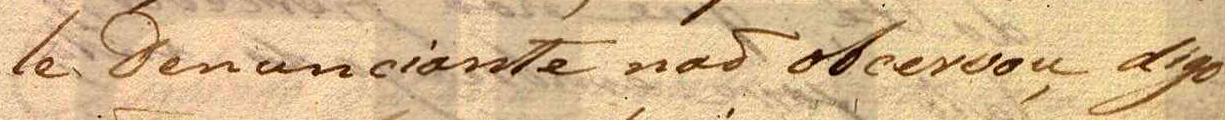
le denunciante naõ observou, digo
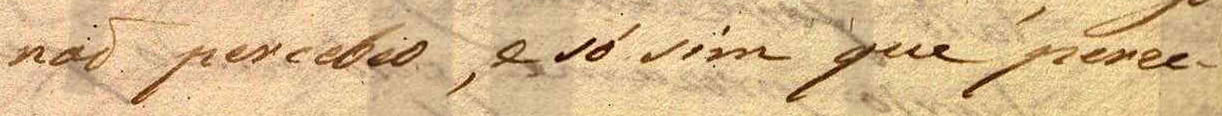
naõ percebeo, e só sim que perce
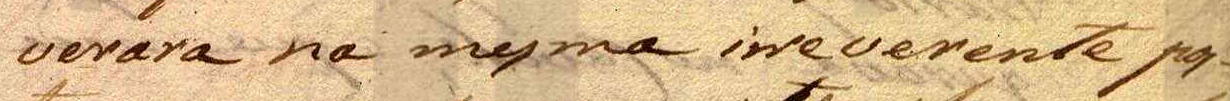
verara na mesma irreverente pos
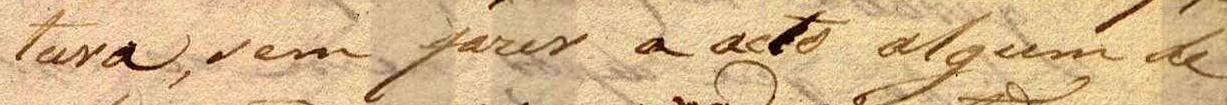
tura, sem fazer a acto algum de
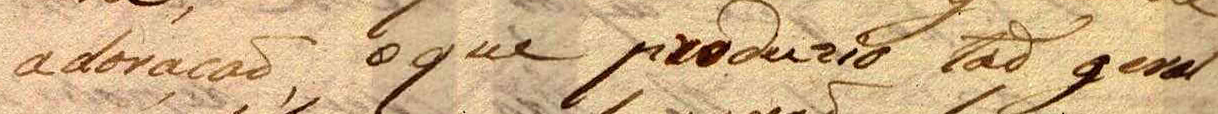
adoraçaõ, o que produzio taõ geral
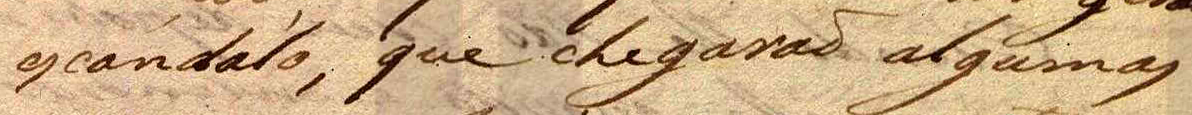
escandalo, que chegaraõ algumas
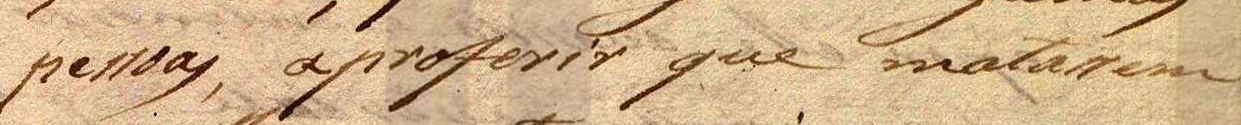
pessoas, a proferir que matassem
